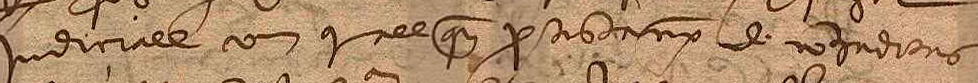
Judiciall com quallq̄r ꝓtestação de cōtraditas
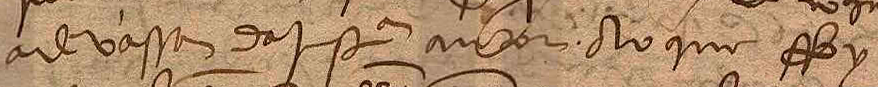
a devassa da Justa autor. Ao que ffoy
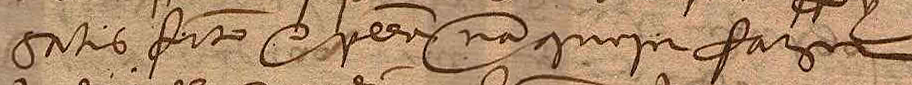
satisfeito e p̄lla nā querer fazer
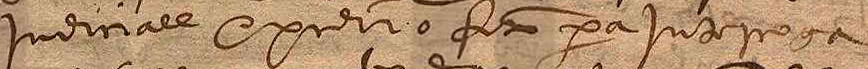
Judiciall e pedir o fct̄o ꝑa Jnterroga
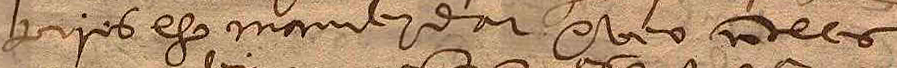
torjos lho mandey dar e veo c̄o elles
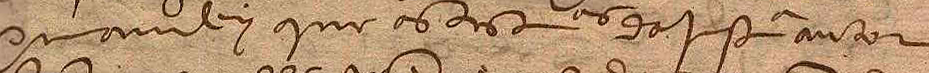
e mandey que as testas da Justa autor
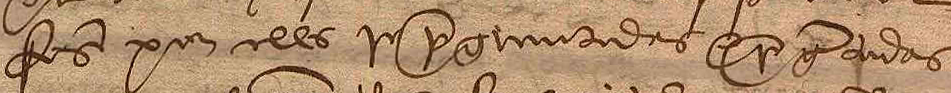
fosē por elles rep̄gumtadas e p̄gūtadas
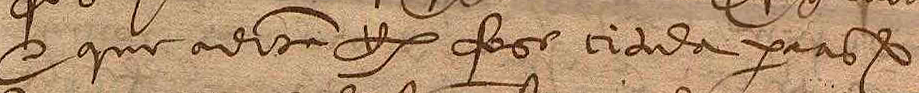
e que a dita Rꝭ fose citada pa as ꝟ
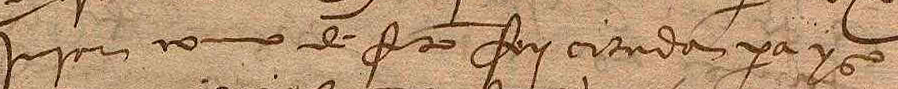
Jurar como de fctō foy citada ꝑa yso
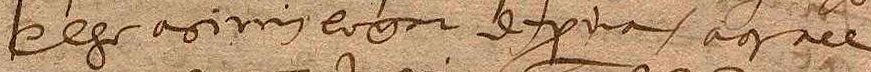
e lhe asiney logar de ꝓua / a quall
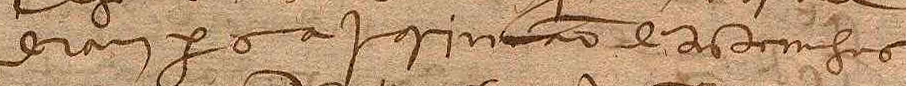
deram ꝑ sua Jnqujrição de testemunhas
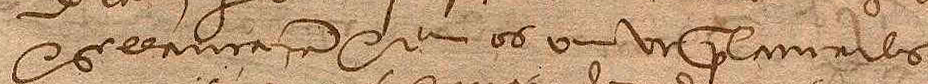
e se llançarā e eu os ouve p̄ lançados
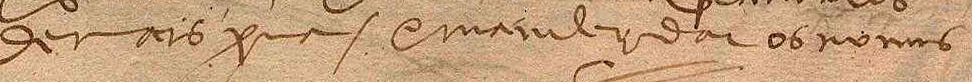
de mais ꝓua /. e mandey dar os nomes
